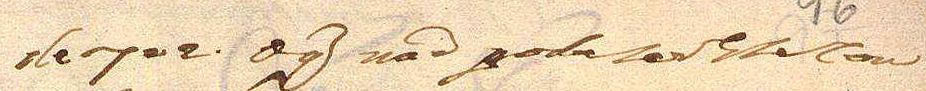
de 702. o q̄ naõ pode ser Ele con
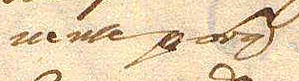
uense porq̄
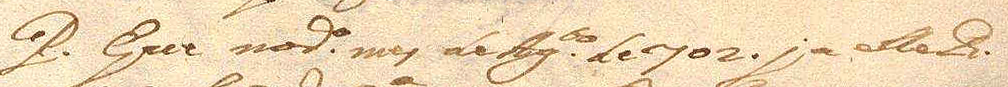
P. Que no d.o mes de Agto de 702. ja elle Reo
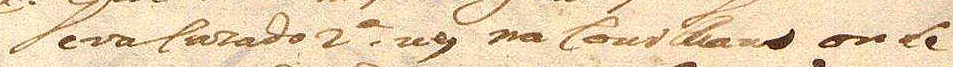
era Cazado 2a ues na Couilham onde
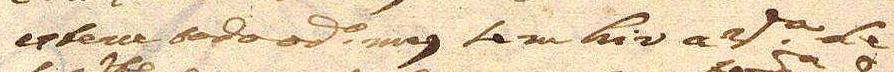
esteue todo o d.o mes sem hir a V.a de
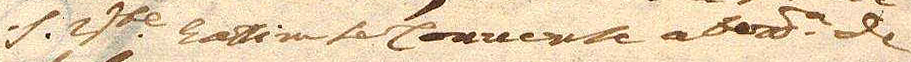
s. Vt.e E asim se Conuense a test.a de
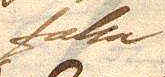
falsa
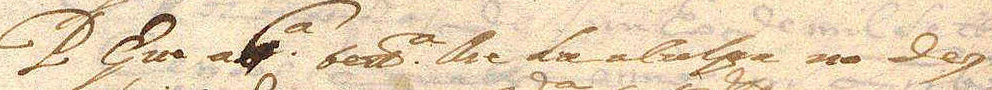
P Que a d.a test.a lhe de a Culpa no des
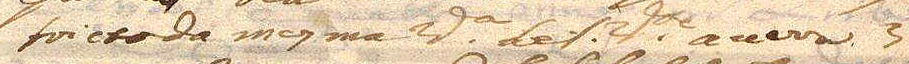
tricto da mesma V.a de S. V.te auera 3.
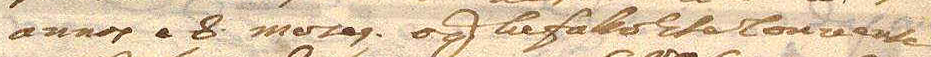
annos e 8 mezes. o q̄ he falso E se conuense
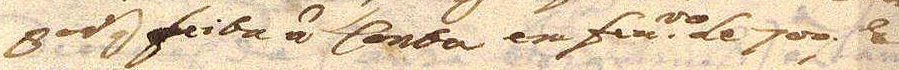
porq̄ feita â Conta em feu.ro de 700; E
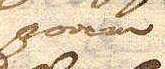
porem
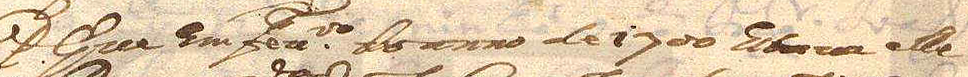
P Que Em feu.ro do anno de i700 Estaua elle
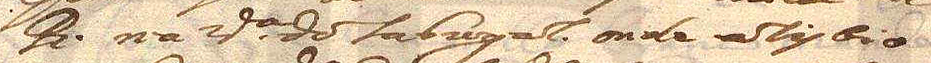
R. na V.a do sabugal onde asistio
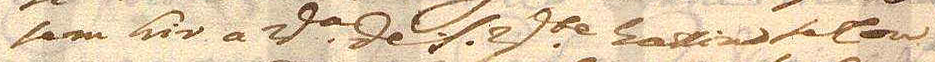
sem hir a V.a de S. V.te E assim se Con
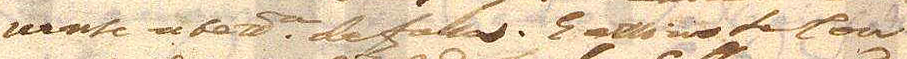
uense a test.a de falsa. E assim se Con
